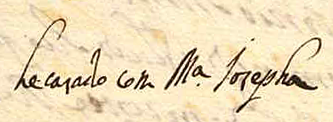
he casado com M.a Josepha
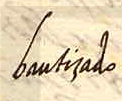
bautizado
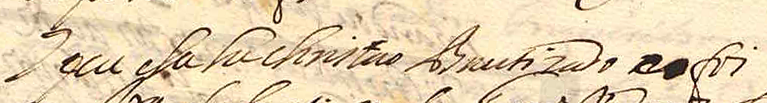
E que elle he christaõ Bautizado e o foi
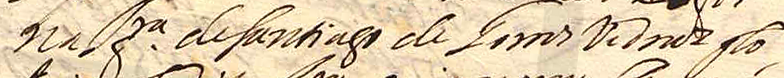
na Igra. de santiago de Torres Vedras plo
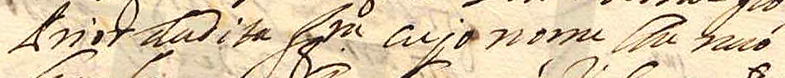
Prior da dita Jg.ra cujo nome lhe naõ
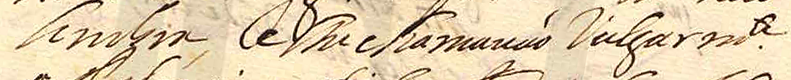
lembra, e lhe chamauaõ Vulgarm.te
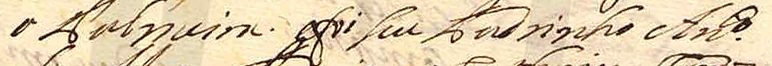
o Palmeira. e foi seu Padrinho Anto.
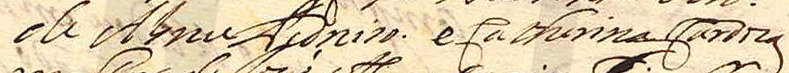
de Abreu Pedreiro. e Catherina Cardoza
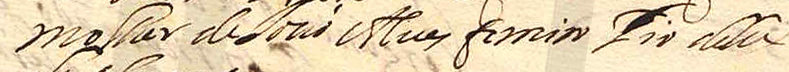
molher de Ioaõ Alues ferreiro Tio delle
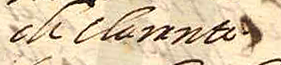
declarante.
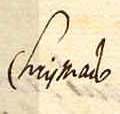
Chrismado
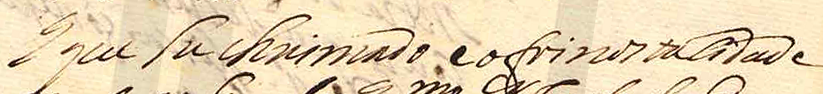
E que he chrismado e o foi nesta Cidade
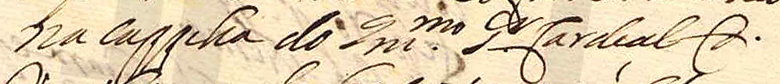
na cappella do Em.mo s.or Cardeal d̄.
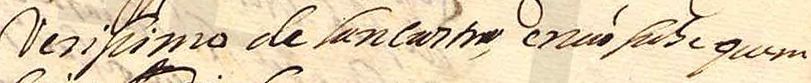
Verissimo de Lancastre, e naõ sabe quem
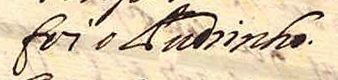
foi o Padrinho.
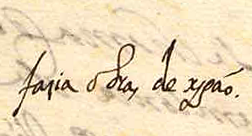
fazia obras de xpaõ.
